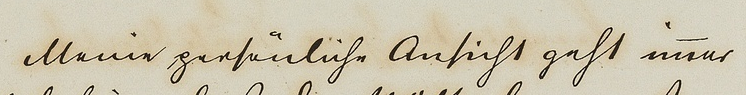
Meine persönliche Ansicht geht immer
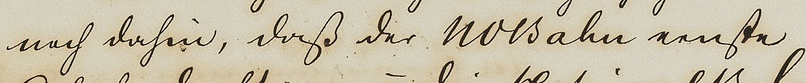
noch dahin, daß der NOBahn ernste
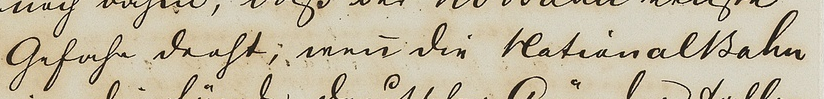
Gefahr droht, wenn die NationalBahn
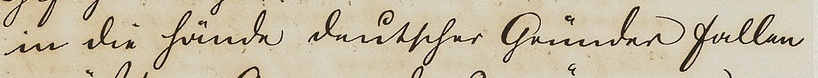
in die Hände deutscher Gründer fallen
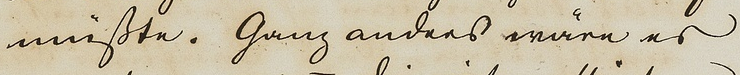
müßte. Ganz anders wäre es
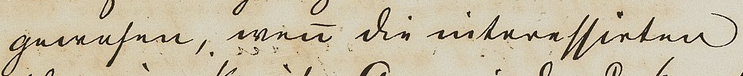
gewesen, wenn, die interessirten
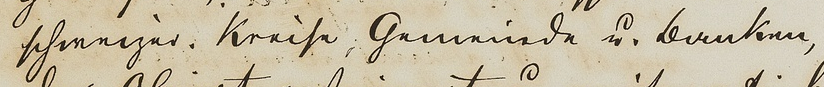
schweizer. Kreise, Gemeinde u. Banken,
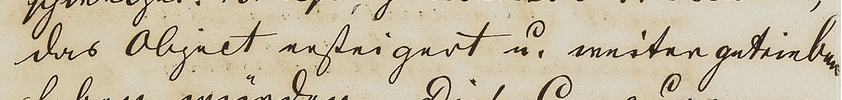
das Object ersteigert u. weiter getrieben
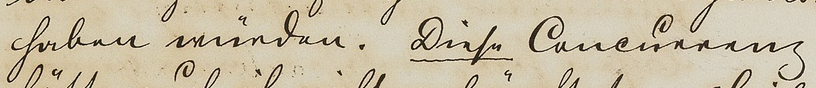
haben würden. Diese Concurrenz
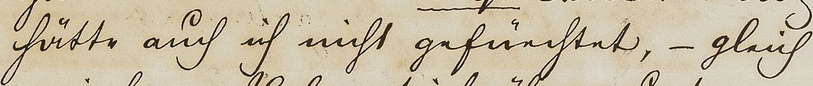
hätte auch ich nicht gefürchtet, – gleich
